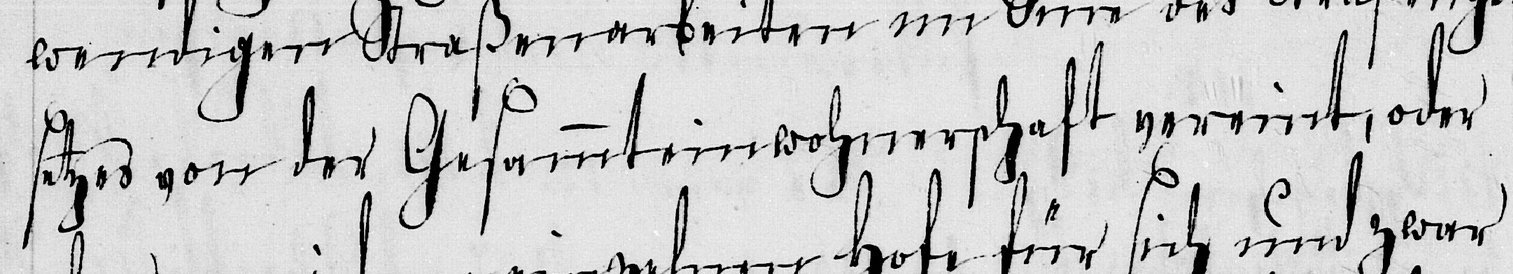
setzes von der Gesammteinwohnerschaft vereint, oder
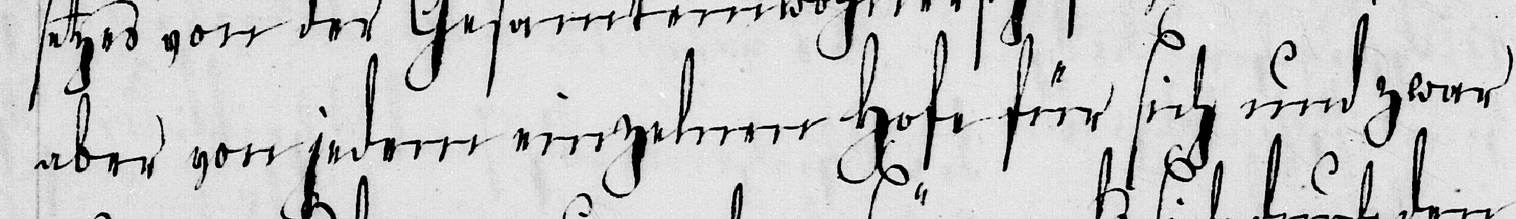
aber von jedem einzelnen Hofe für sich und zwar
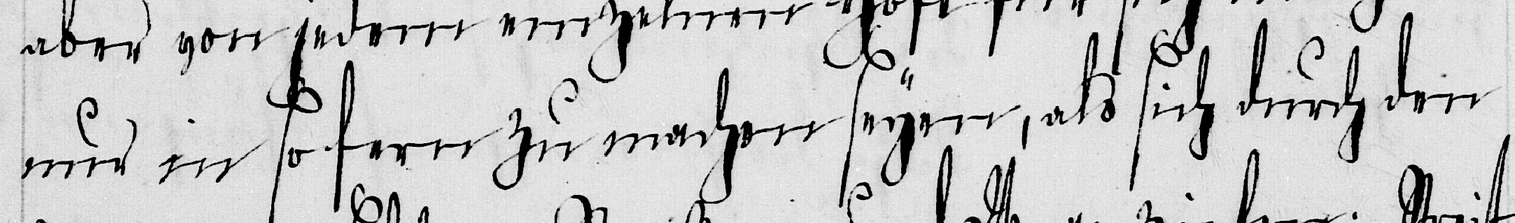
nur in so fern zu machen seyen, als sich durch den
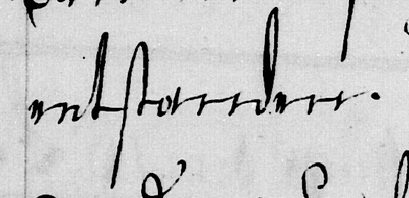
entstanden.
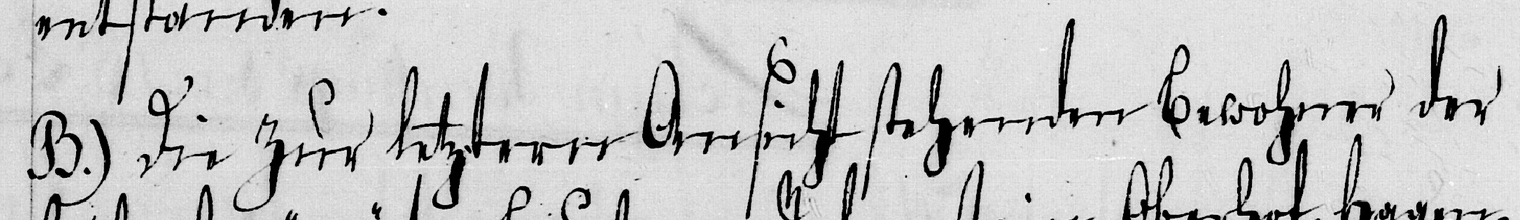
B.) Die zur letztern Ansicht stehenden Bewohner der
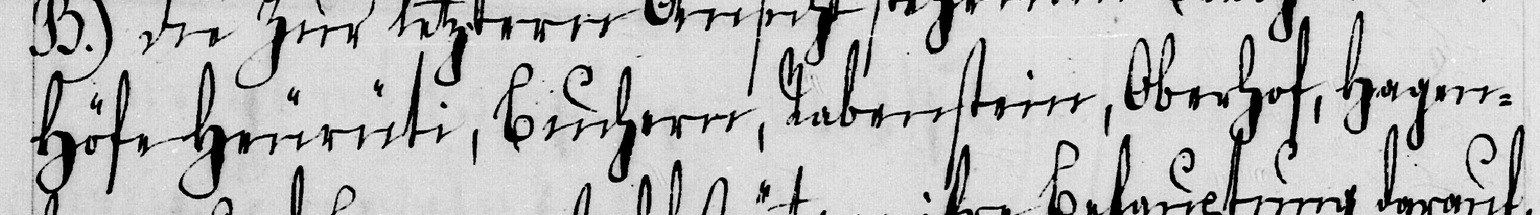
Höfe Heurüti, Buchern, Rabenstein, Oberhof, Hagen¬
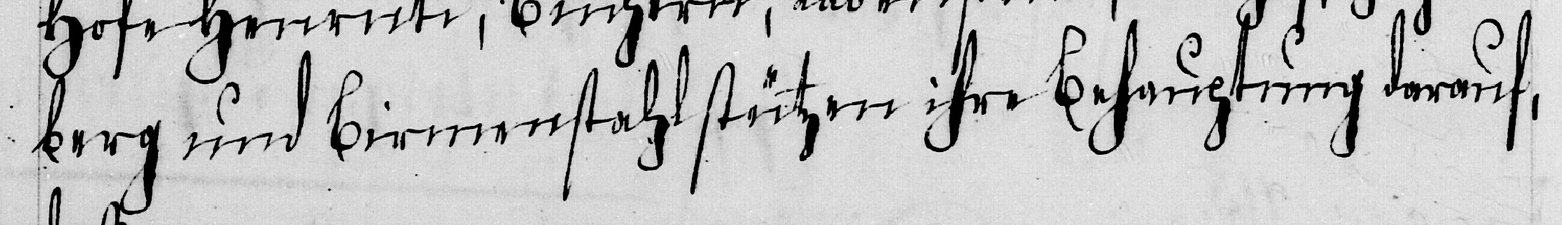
berg und Birmenstahl stützen ihre Behauptung darauf,
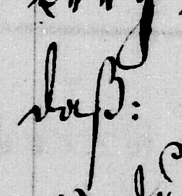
daß:
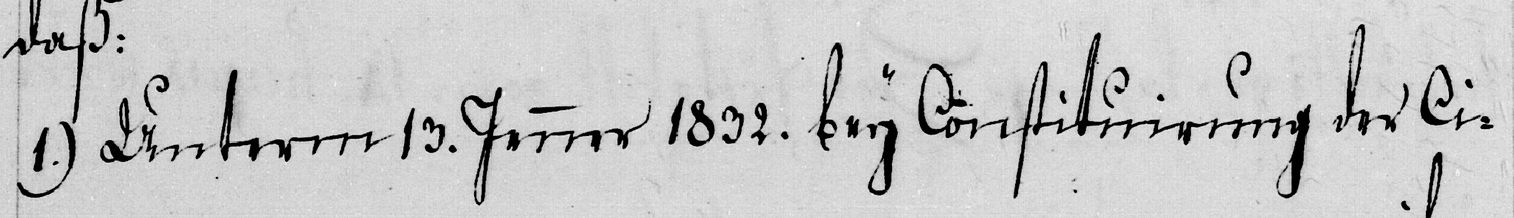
1.) Unterm 13. Jenner 1832. bey Constituirung der Ci
